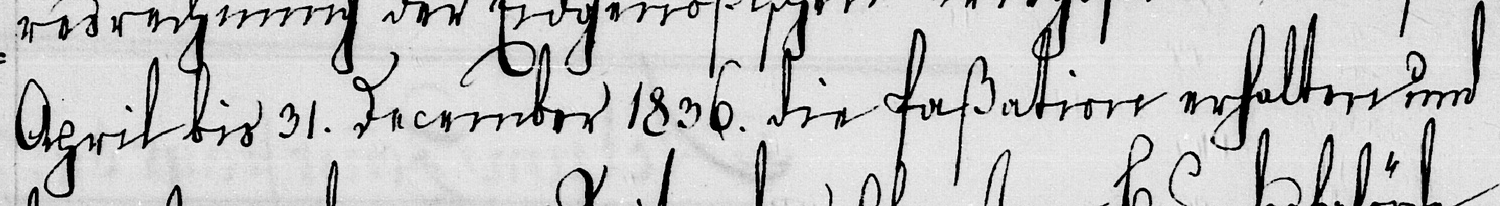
April bis 31. December 1836. die Paßation erhalten und
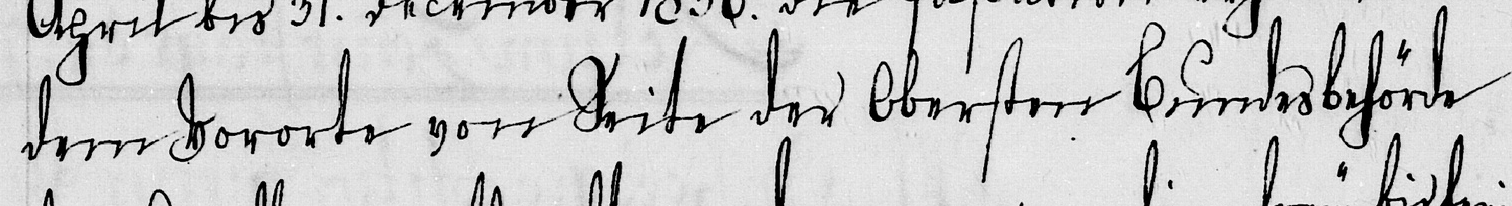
dem Vororte von Seite der Obersten Bundesbehörde
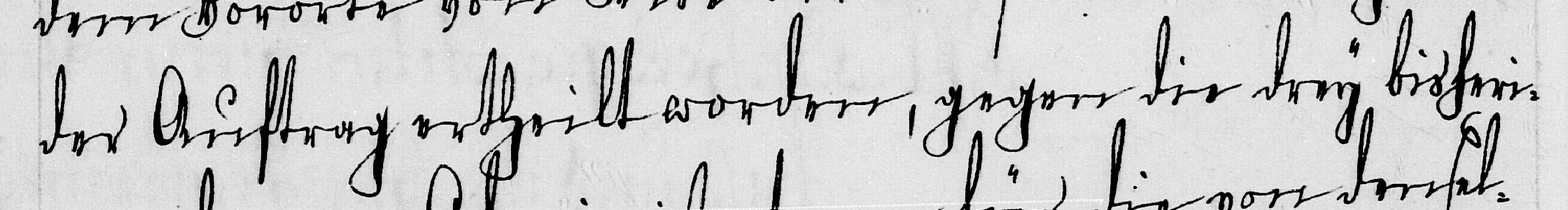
der Auftrag ertheilt worden, gegen die drey bisheri¬
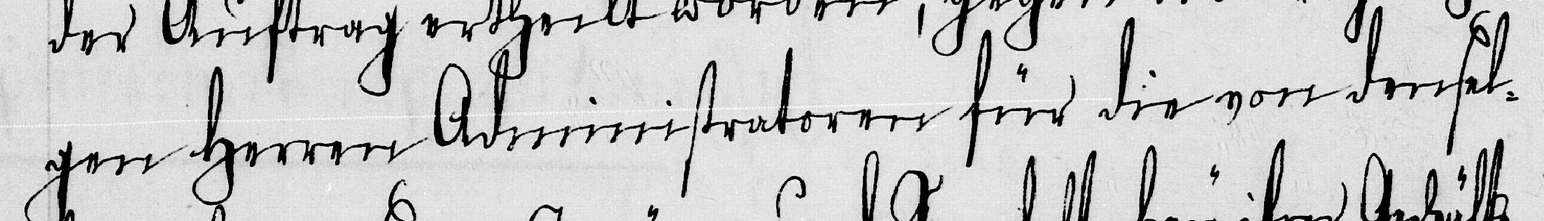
gen Herren Administratoren für die von densel¬
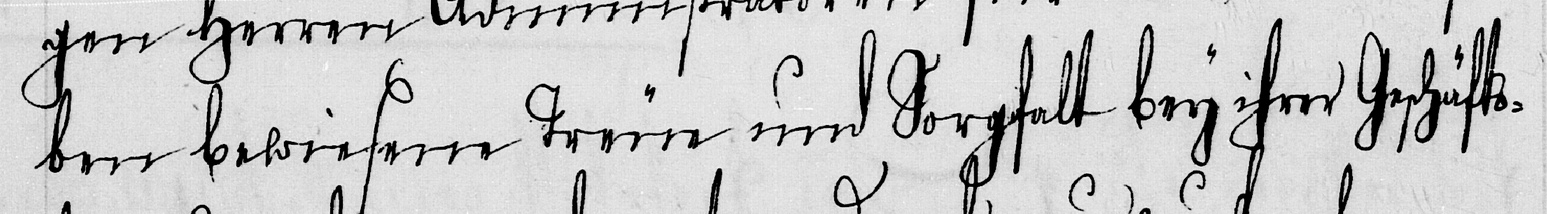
ben bewiesene Treue und Sorgfalt bey ihrer Geschäf¬
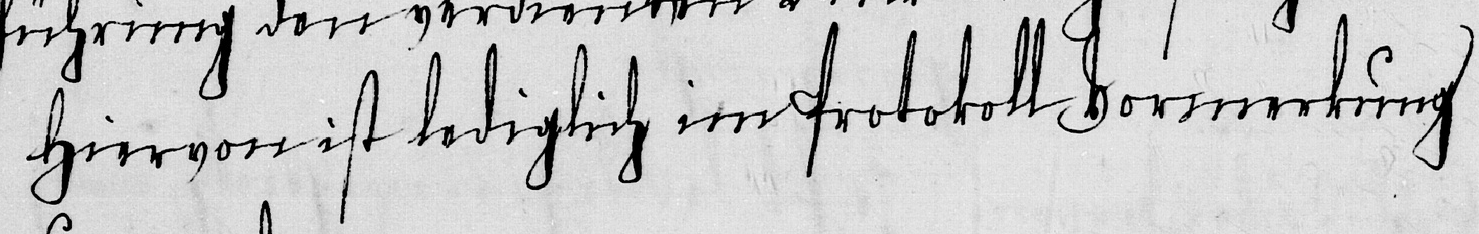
Hiervon ist lediglich im Protokoll Vormerkung
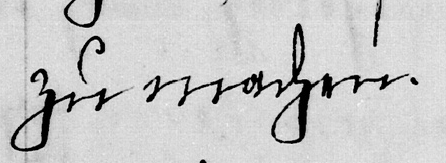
zu machen.
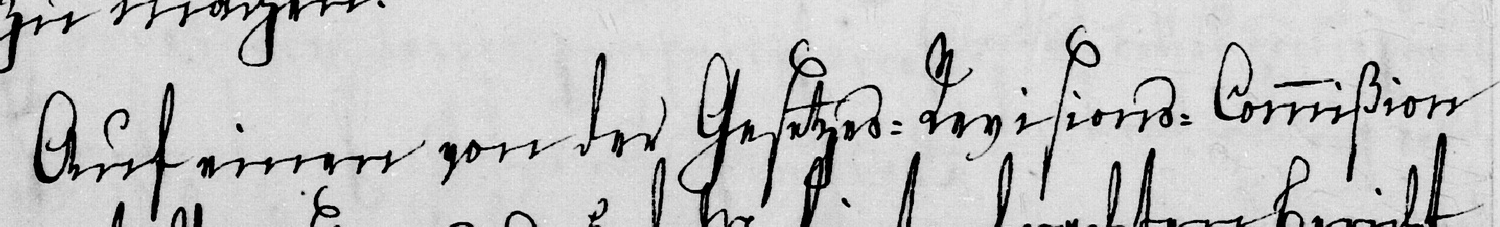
Auf einen von der Gesetzes-Revisions-Commißion
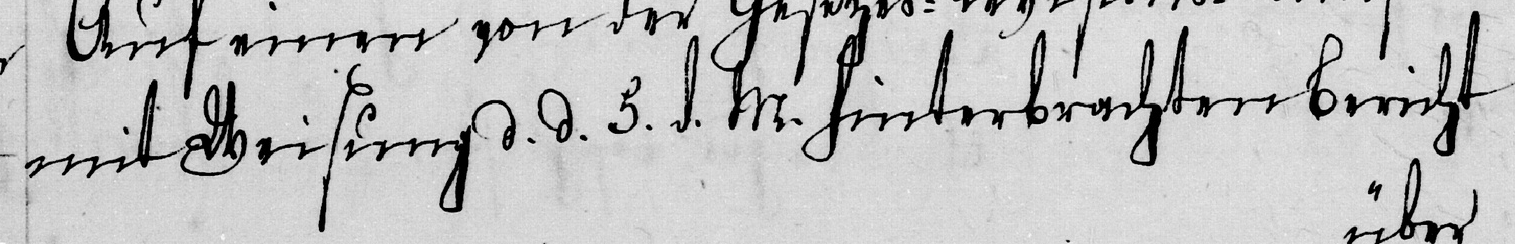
mit Weisung d. d. 5. d. M. hinterbrachten Bericht
